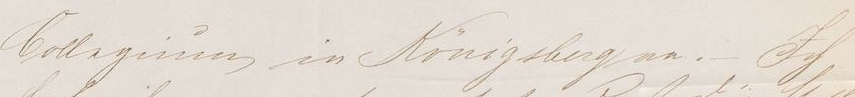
Collegium in Königsberg an. – Ich
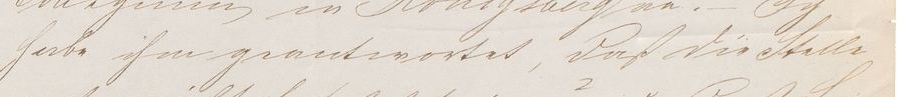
habe ihm geantwortet, daß die Stelle
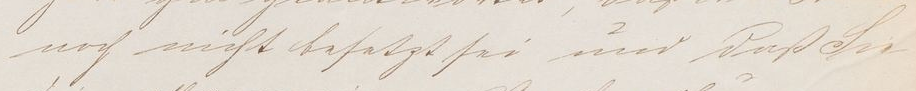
noch nicht besetzt sei und daß Sie
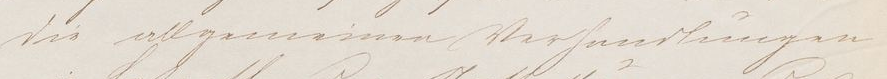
die allgemeinen Verhandlungen
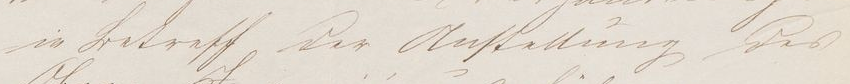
in Betreff der Anstellung des
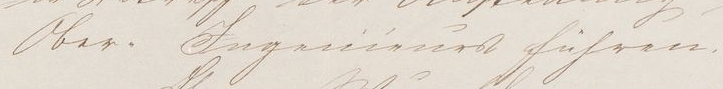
Ober-Ingenieurs führen.
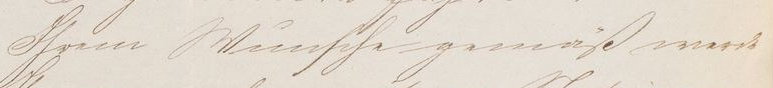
Ihrem Wunsche gemäß werde
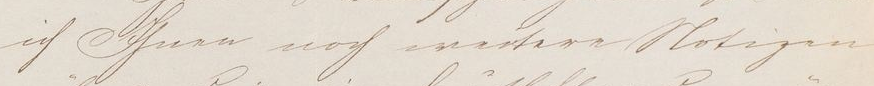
ich Ihnen noch weitere Notizen
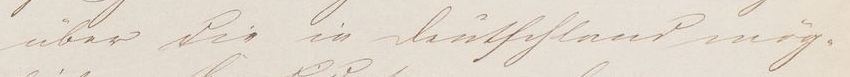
über die in Deutschland mög-
